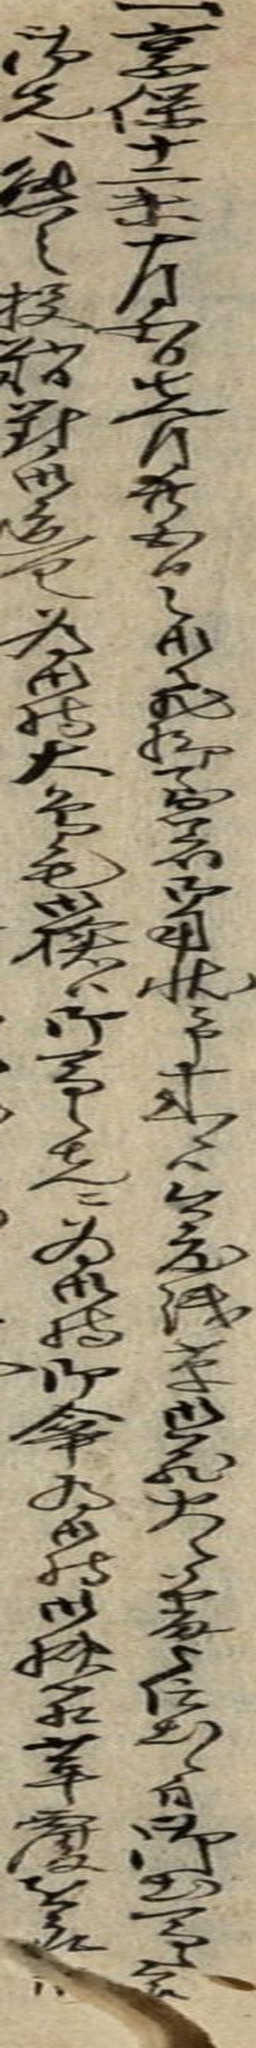御先へ熊之投鞘対御道具為御持大鳥毛御槍は御馬之先に為御持御傘為御持御挟箱草履を取
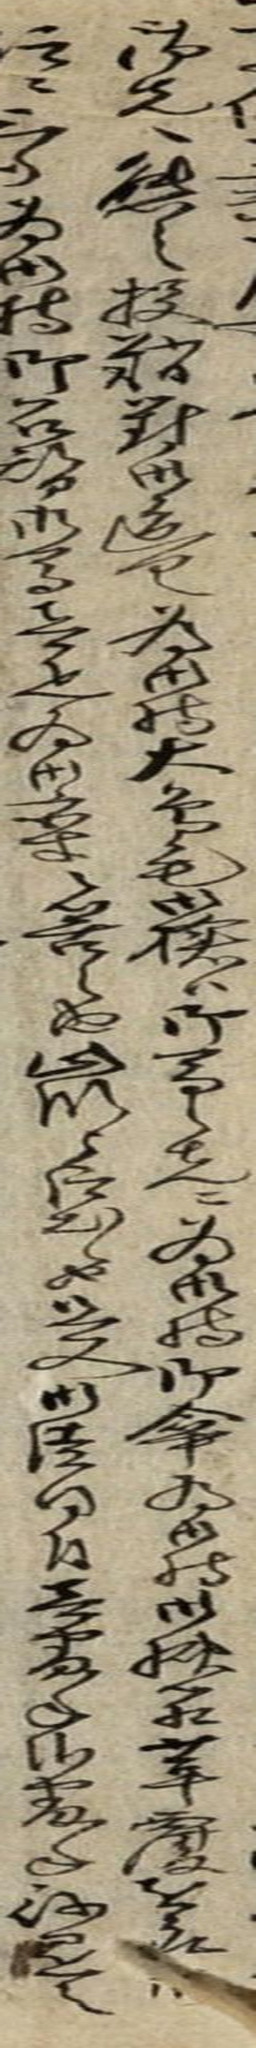跡に三つ為御持御召替御馬壱疋為御牽候筈之由此段被仰出候由且又御徒目付壱番手弐番手役懸之
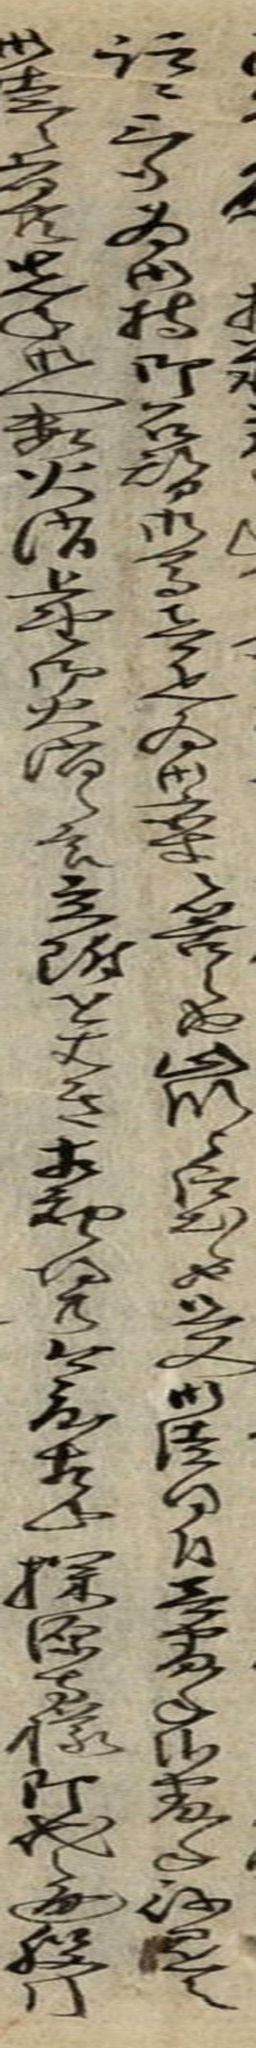御徒之者共先手御人数火消上野御火消之節立附をはき相勤候得共今度相止探源寺様御代之通股引
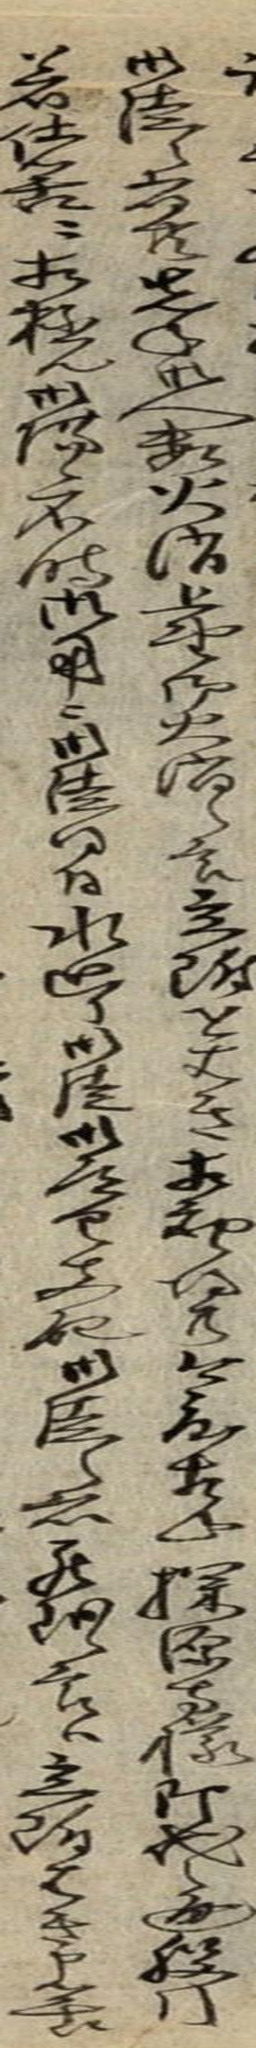着仕筈に相極る御場へ不時御用に御徒目付水廻り御徒御道具支配御徒之者罷越候節は立附はき申筈
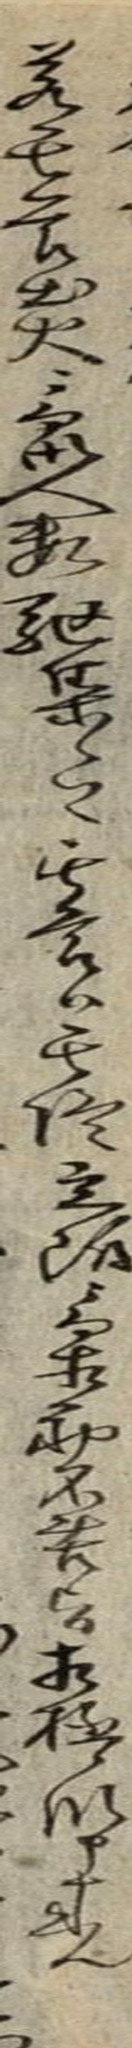若其節出火にて御人数駆集候はゝ其節は其儘立附にて相勤不苦旨相極候段申来る
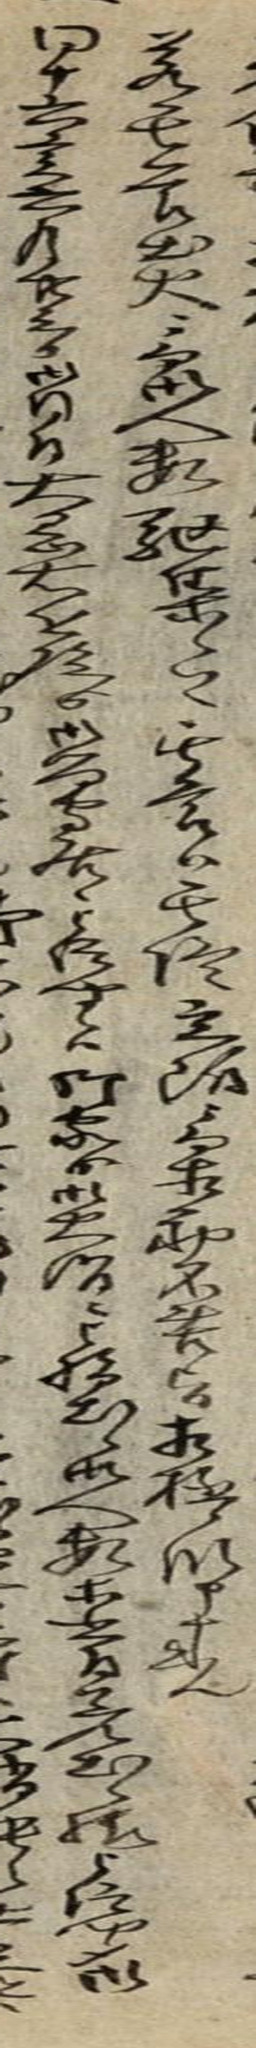一同十六亥六月廿三日御目付大岡右近殿ゟ御留守居へ被仰聞候は御家ゟ御火消に被指出候御人数等書付差出候様被仰聞御
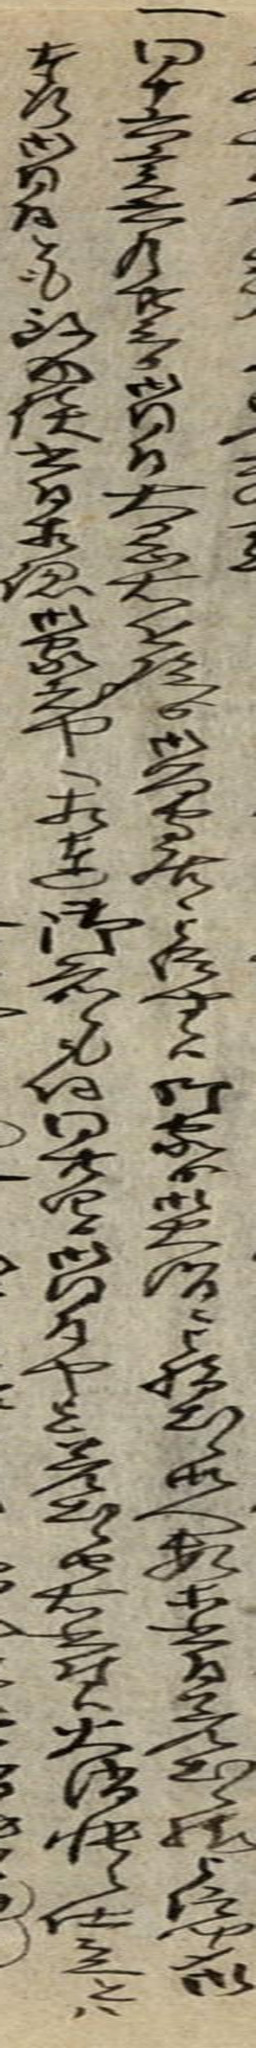奉行御目付とも致内談書付相認御家老中へ相達御前へも伺同廿四日御目付中迄差出候由右書付は火消帳之仕立とは
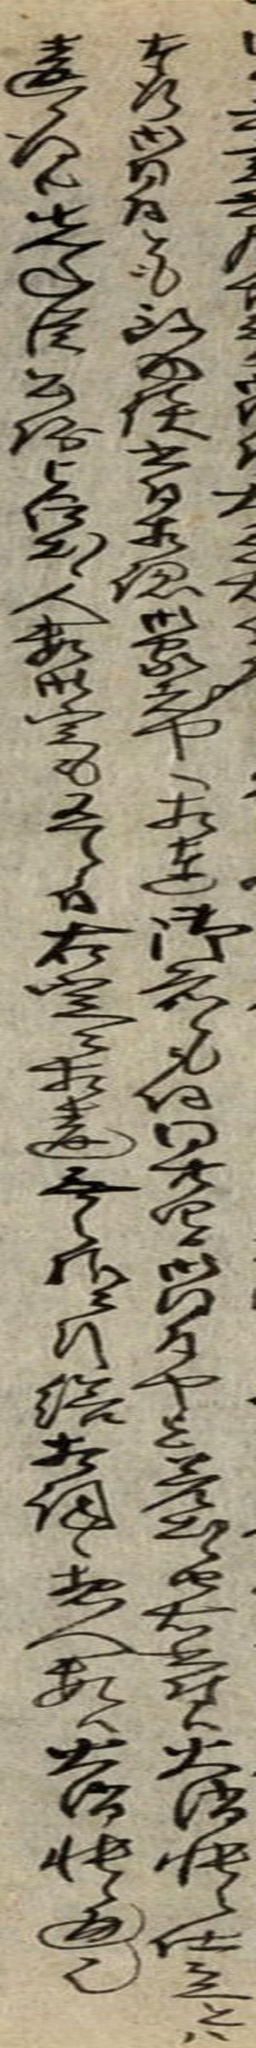違候得共先年従公儀被仰出候人数御定も有之に付右定に相違無之様に引繕相伺候惣人数は火消帳之通也
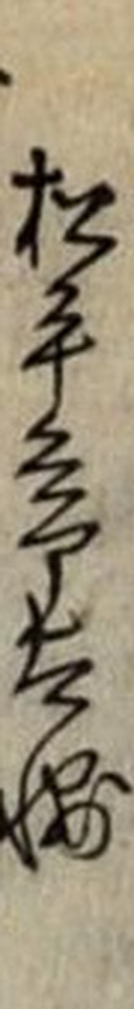松平兵部大輔
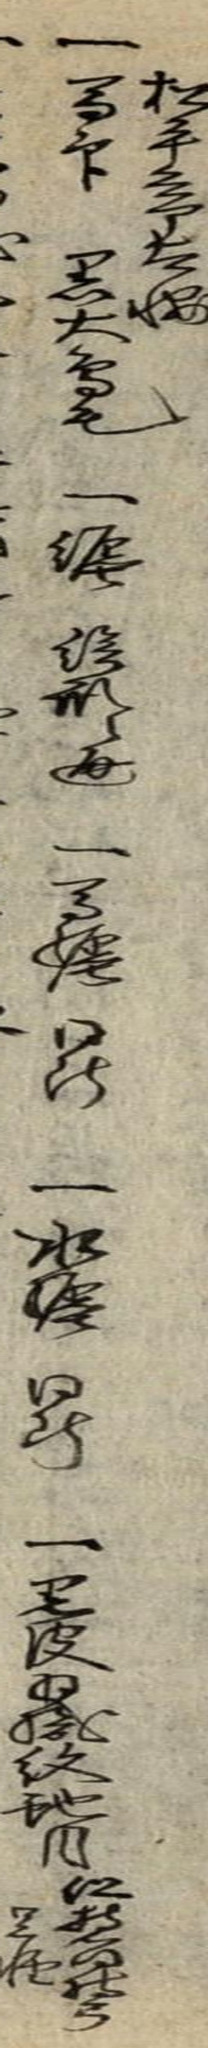一馬印黒大鳥毛一纏絵形之通一馬纏同断一水纏同断一黒皮羽織紋蛇目但持筒持弓足軽
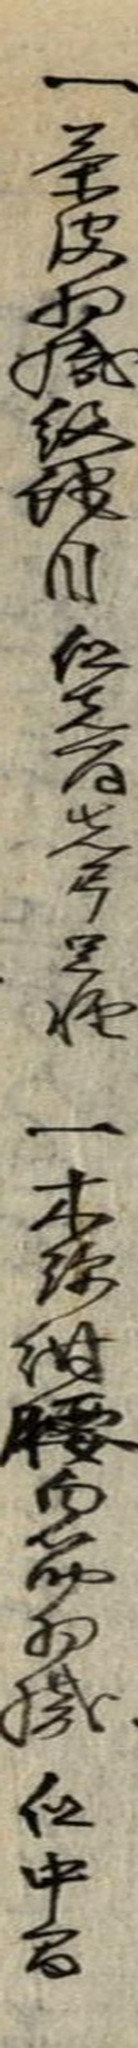一茶皮羽織紋蛇目但先筒先弓足軽一木綿紺腰白筋羽織但中間
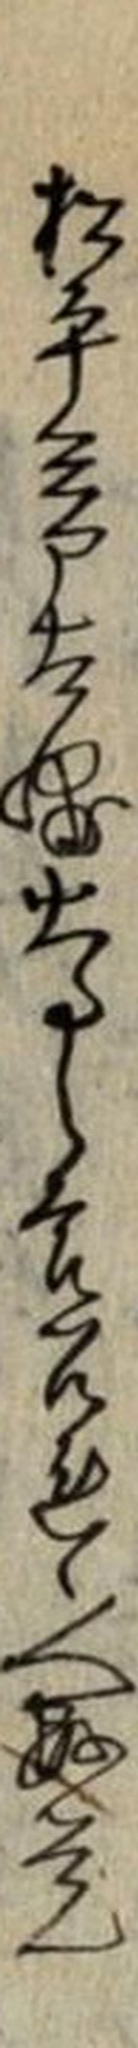松平兵部大輔火事之節召連候人数覚
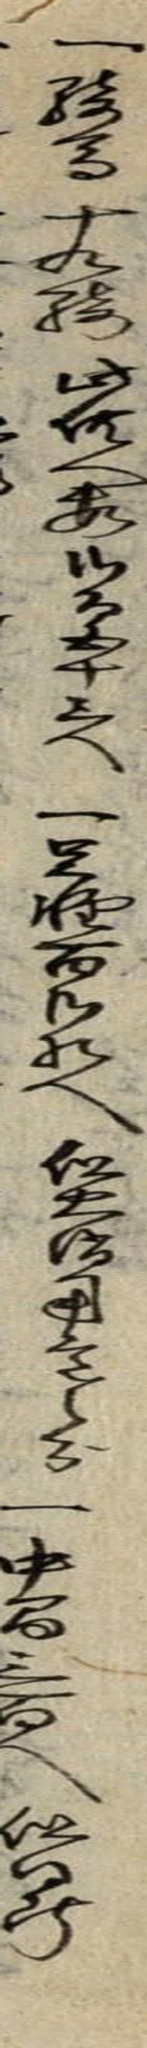一騎馬十九騎此供人数弐百五十三人一足軽百弐拾人但火消用意之分一中間三百人但同断
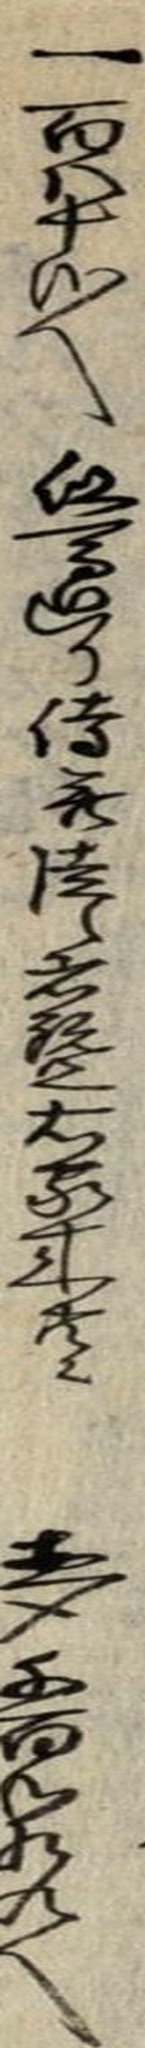一百八十弐人但馬廻り侍并徒之者頭且右家来共に惣〆千百弐拾九人
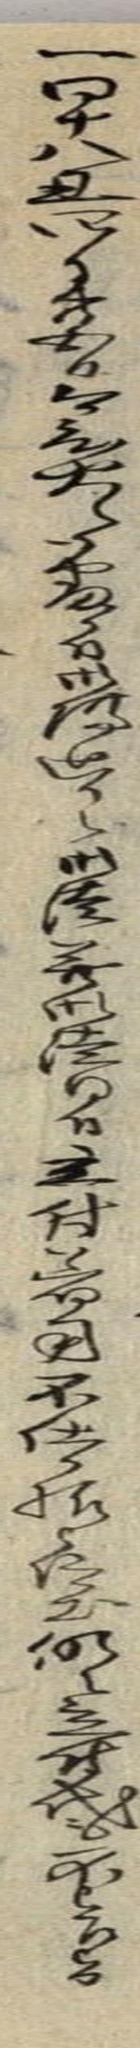一同十八丑四月廿五日今度火之御番に付御場廻り之御徒并御徒目付立付着用不仕候様被仰出仍之立付代も不被下旨
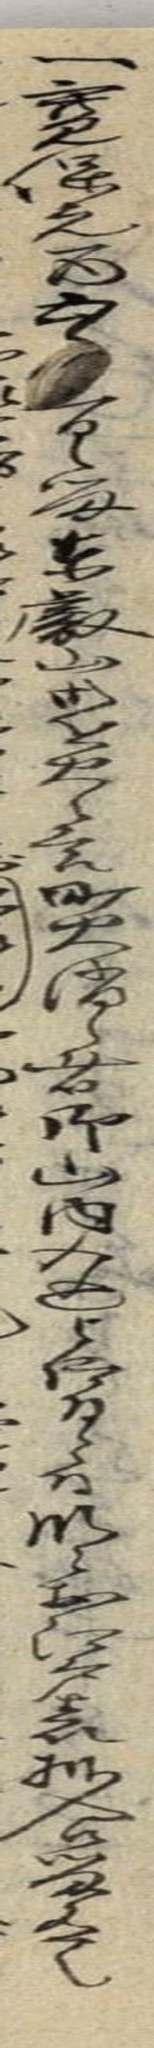一寛保元酉五月日之留東叡山御近火之節町火消之者御山内入込被仰付候に付段々於江戸表掛合留有之
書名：三都并道中之部
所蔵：福井県文書館 Fukui Prefectural Archives
